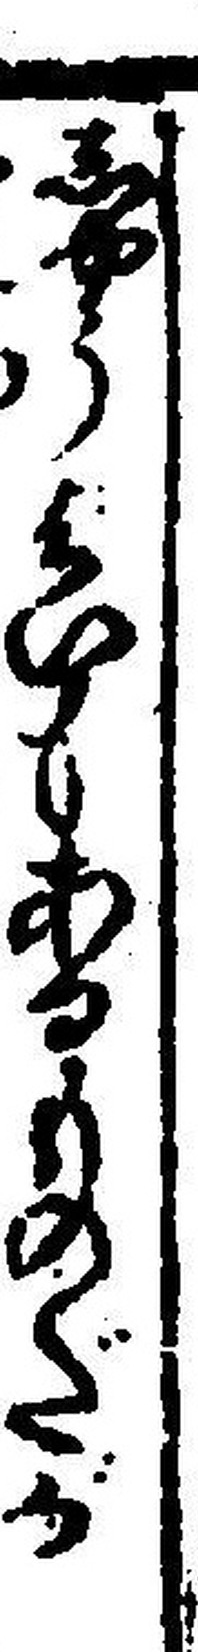しやうばいもあるものだが
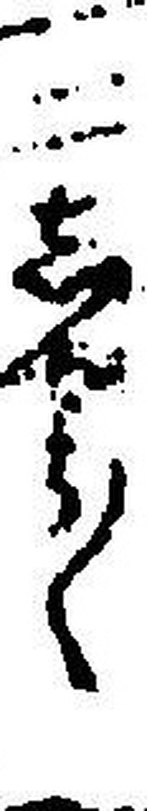しやう〳〵
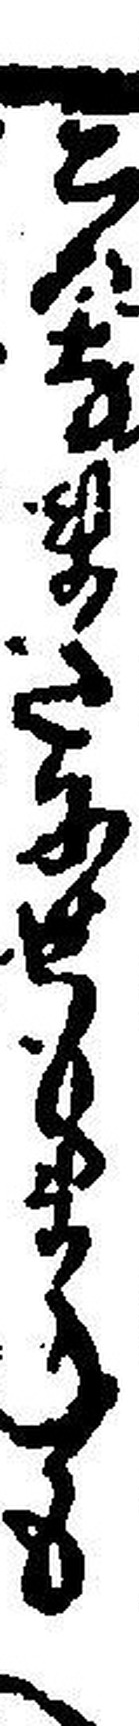こんなまたにせもまねも
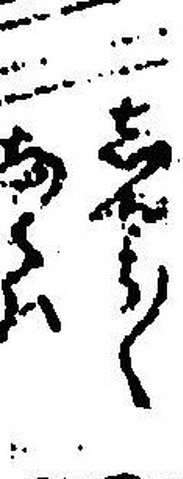ならは
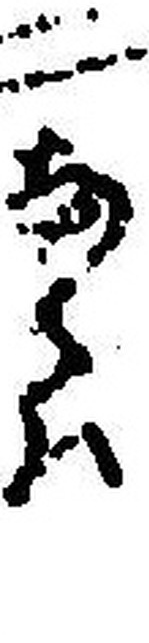ならは
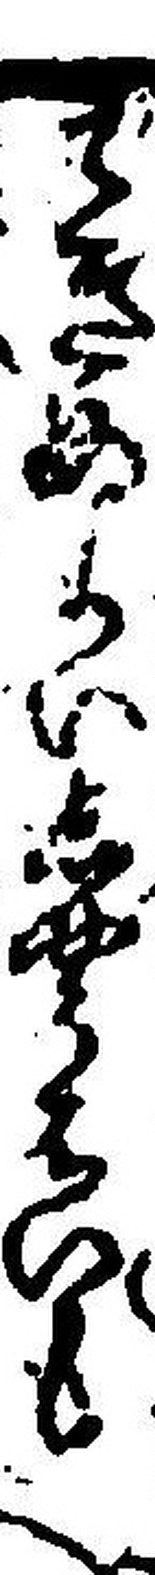できぬよいしやうはいも
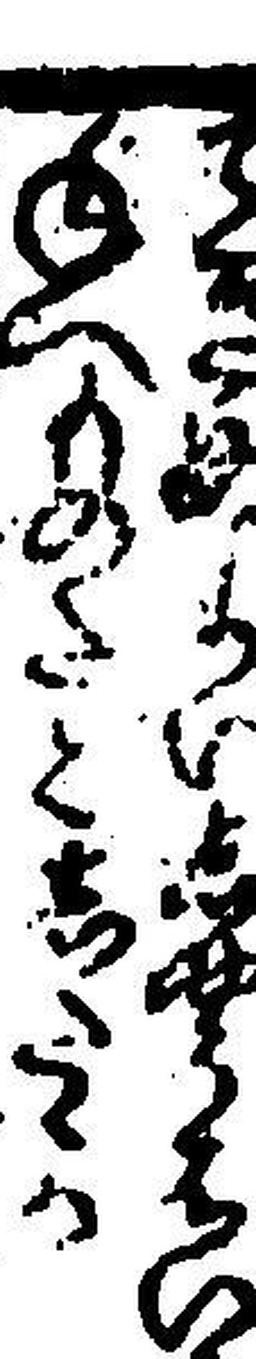ねへものたとしたゝか
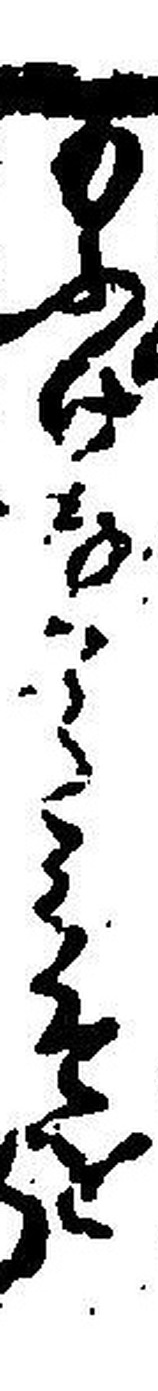もふけなからみそを
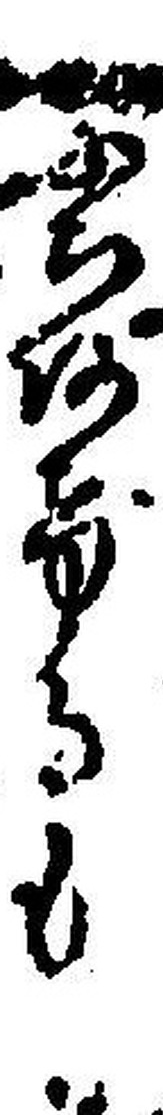ふちあげるも
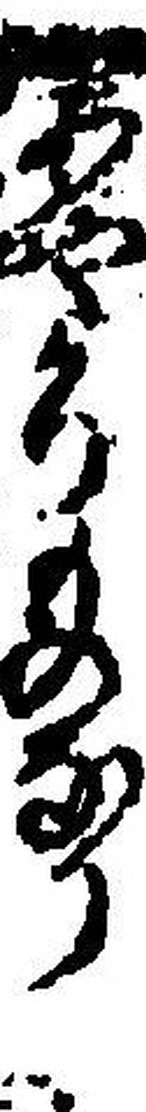あやかりものなり
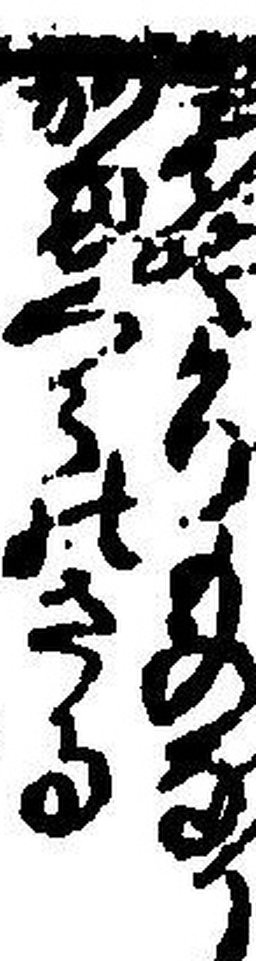かまくらのさる
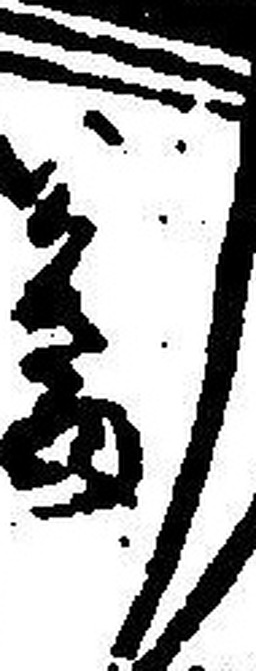いかさま
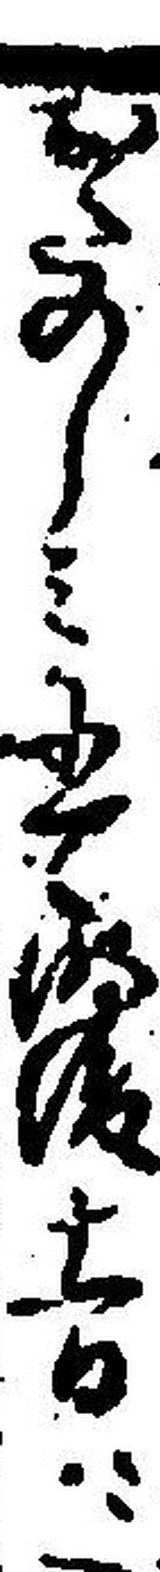おたのしみにて時後？十一日
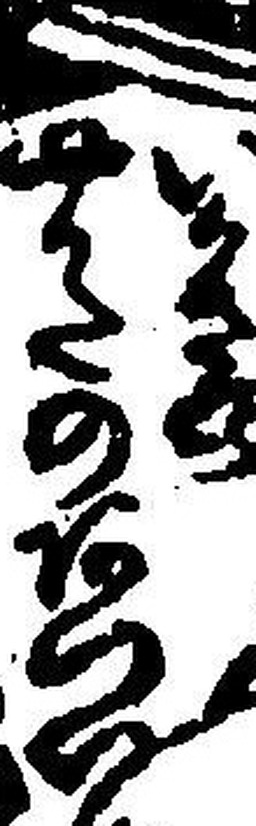やかたのあつい
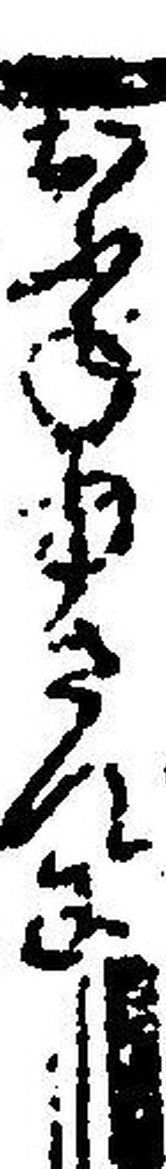おふねゆさんに
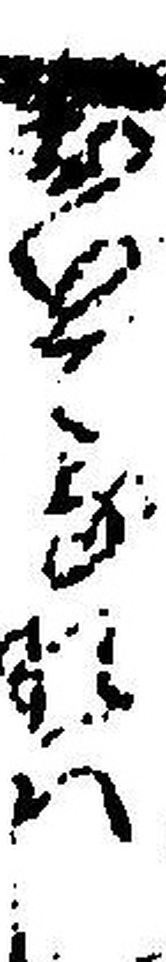おいてなれは
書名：天竺儲之筋 / 市場通笑作
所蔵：東京大学総合図書館 General Library in the University of Tokyo, JAPAN
